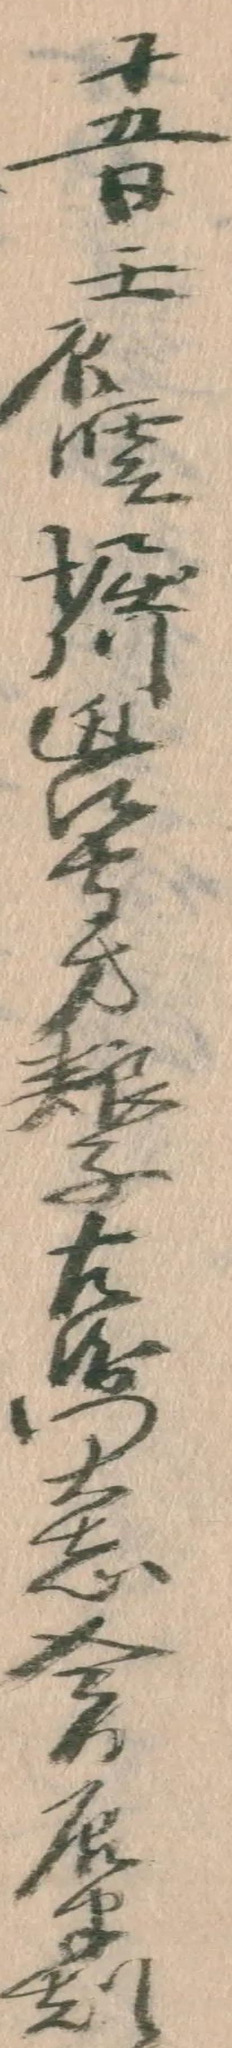十五日壬辰曇堀川近江守方粮子左衛門大志今日辰半刻
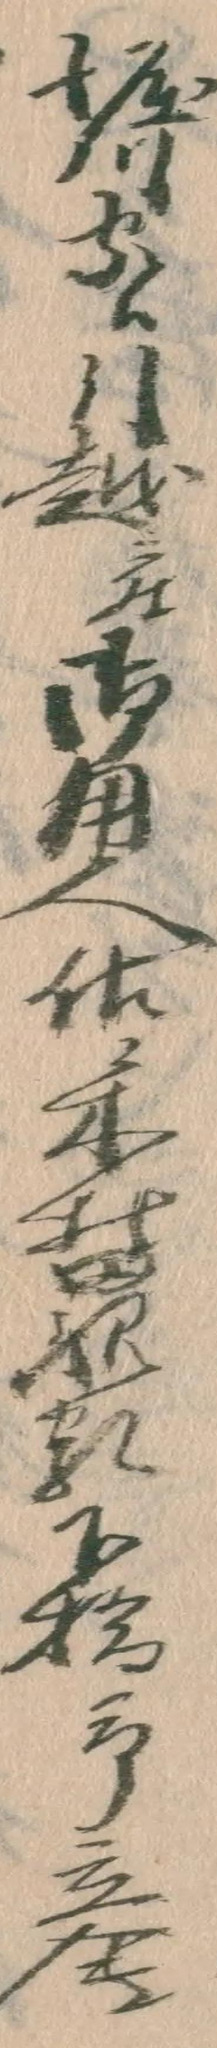堀川家え引越ニ付御用人佐々木村田親類下橋予立會
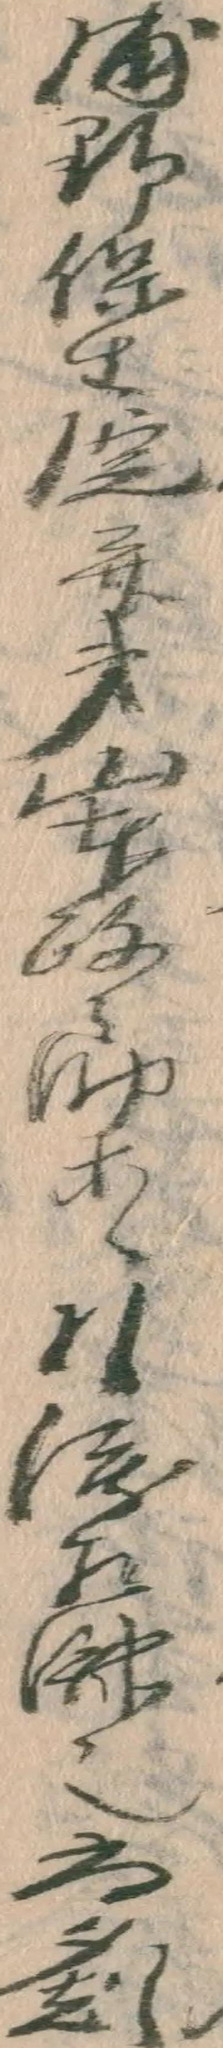浦野保生院幷弟山本政之助等へ引渡相済也尚夕刻
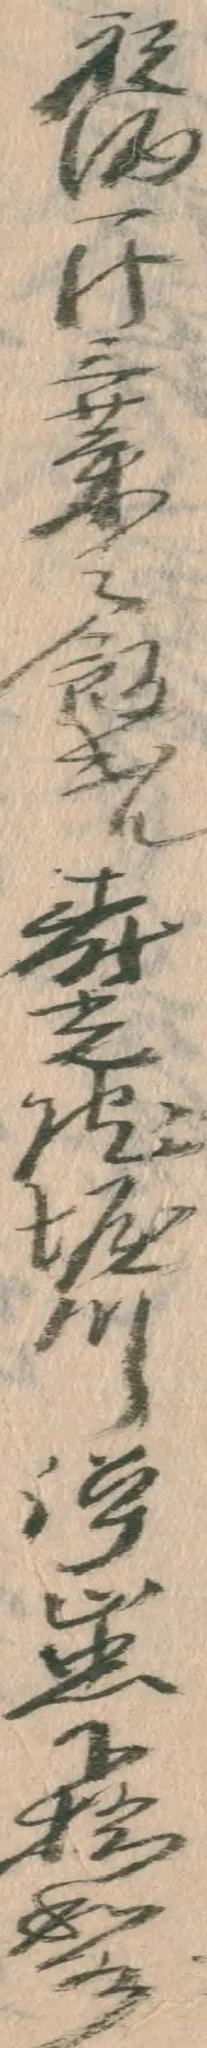祝酒一汁三菜之飯出ル寿光院堀川弾正忠下橋和泉
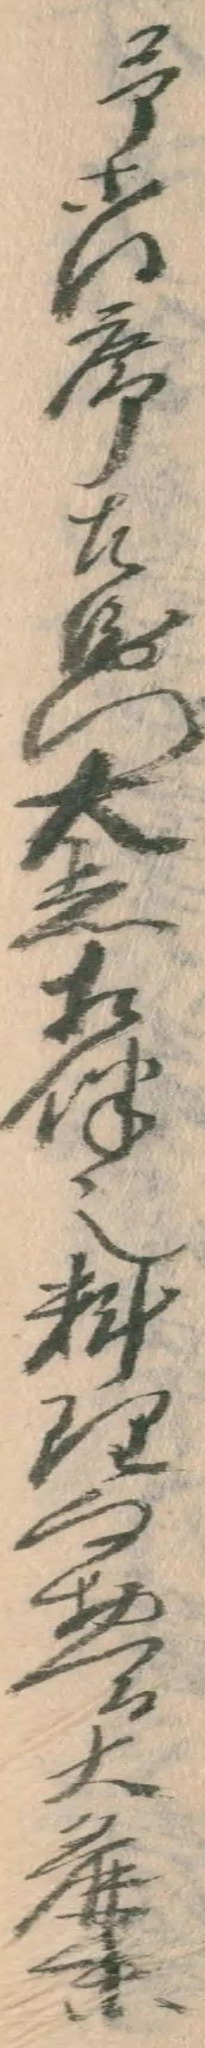予等同席左衛門大志相伴之料理向惣而大麁末
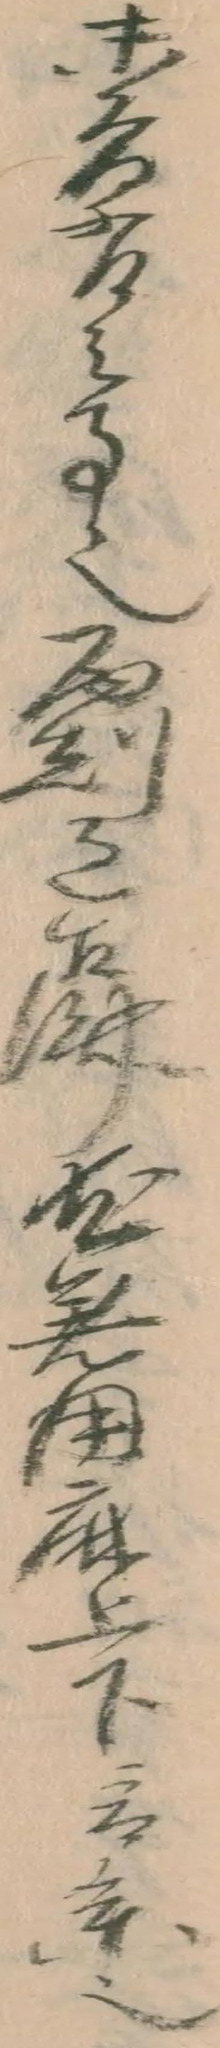未曾有之事也酉刻過相済尤暑用麻上下ニ而参也
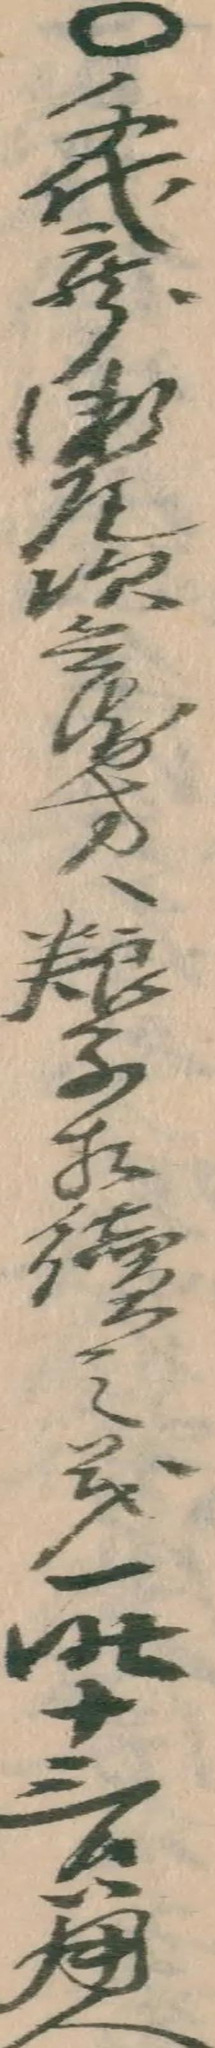○千代蔵瀬尾次兵衛方へ養子相続之義一昨十三日は用人
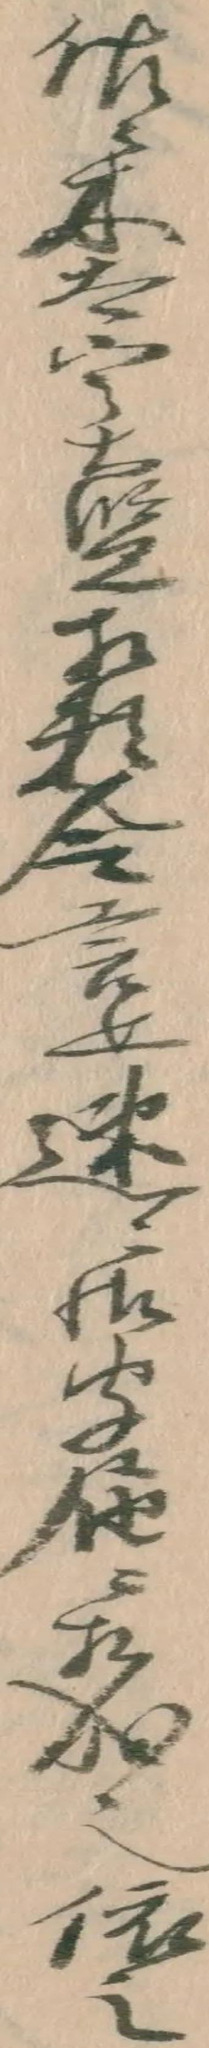佐々木太宇覧相頼令言上速二御聞届二相成候依之
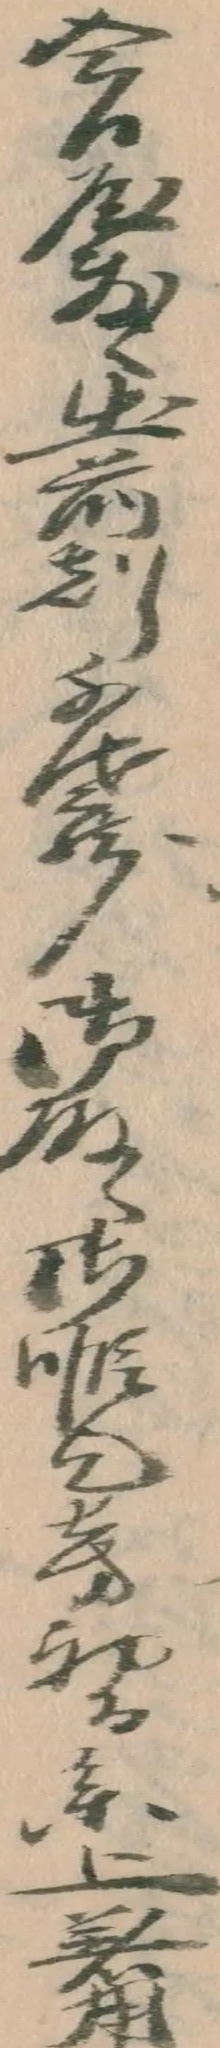今日屋敷へ出前刻千代蔵御殿へ御暇乞旁初而参上着用
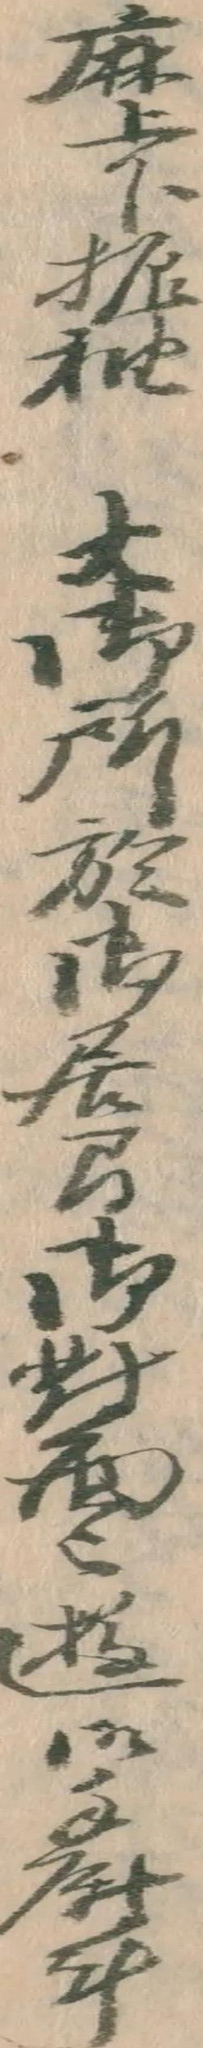麻上下振袖大御所於御居間御對面被遊御手熨斗
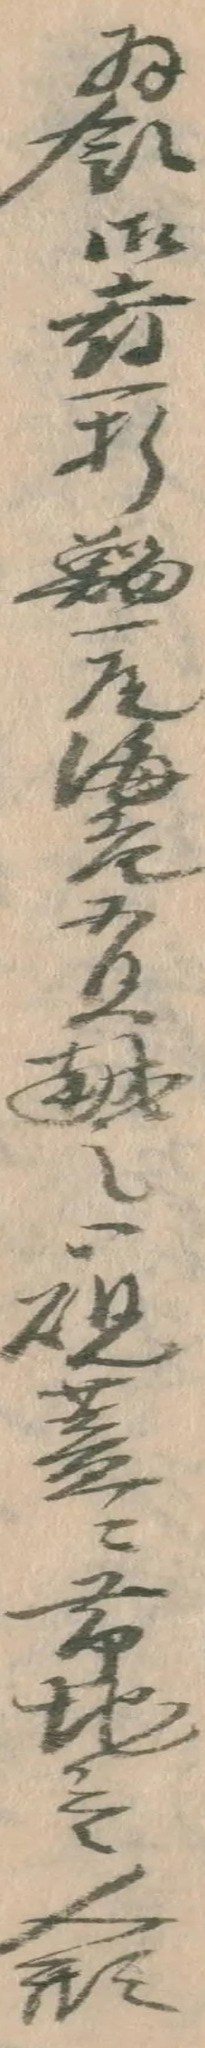拝領御肴一折鯣一尾海老五貝献之御硯蓋二帯地壱人形
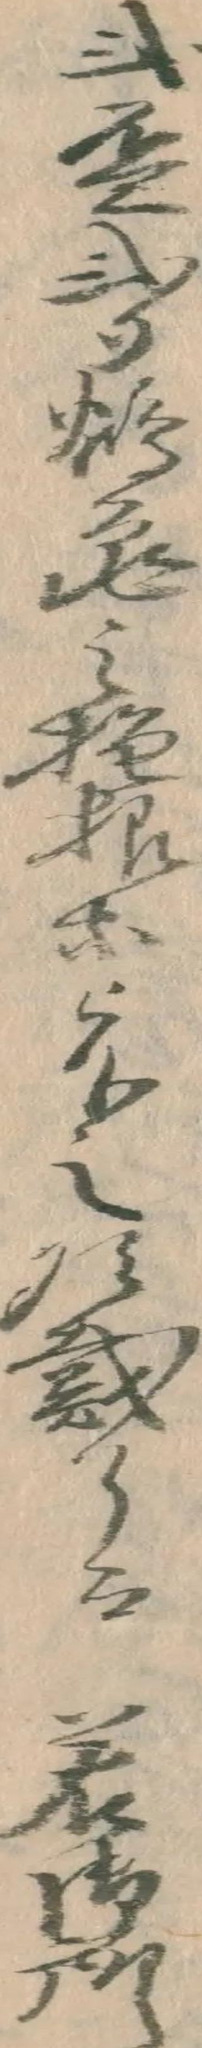弐盃弐ツ鶴亀之抱根等被下之頂戴了而若御所
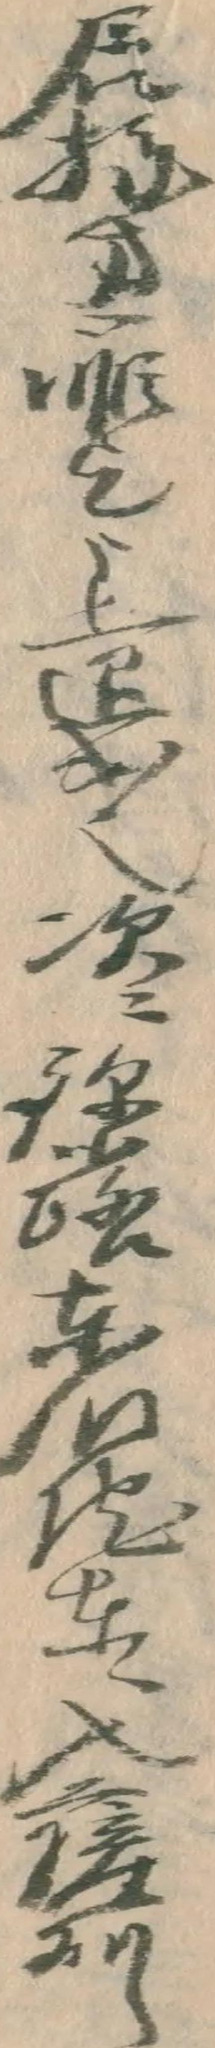君様方へ暇乞申上退出也次ニ錦小路東洞院東へ入薩州
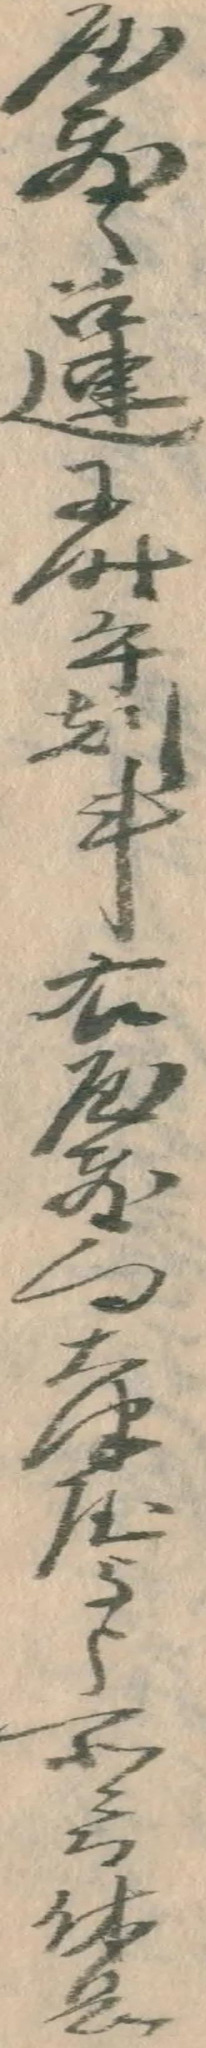屋敷へ召連于時午刻斗右屋敷向大津屋と申所二而休息
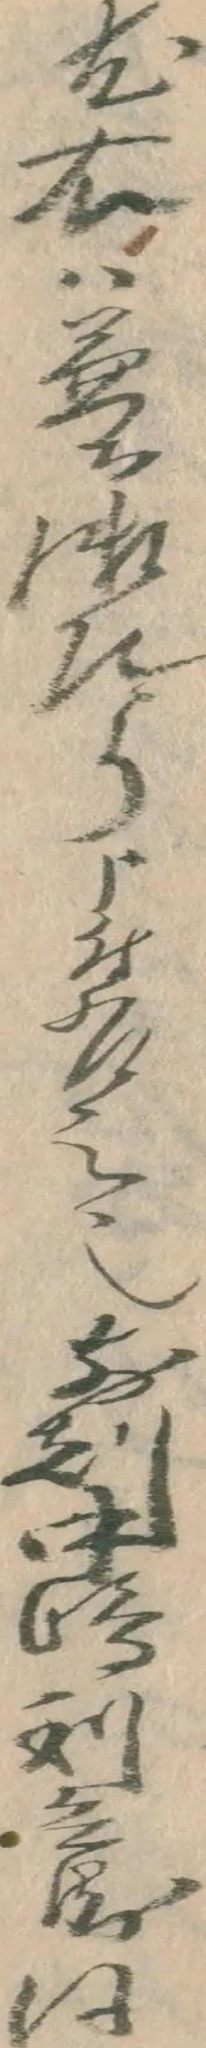尤右ハ兼テ瀬尾より申付有之候也前刻中嶋利兵衛同
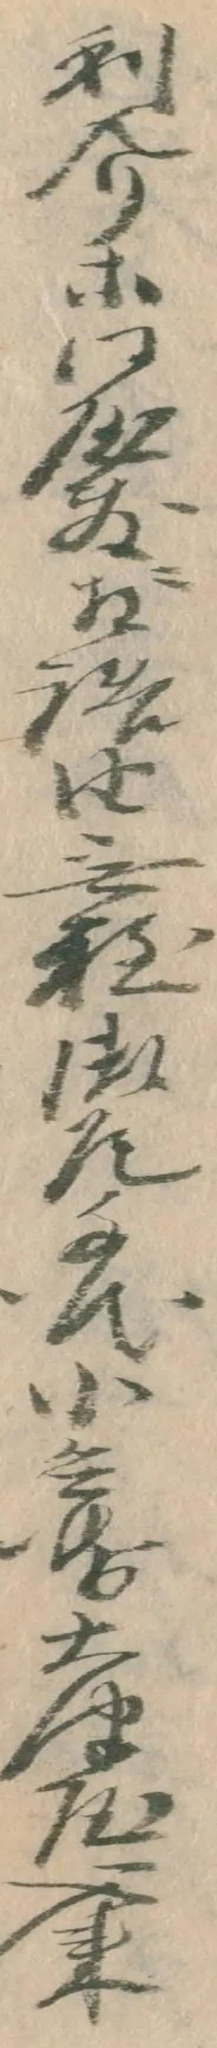利介等同屋敷ニ相詰由無程瀬尾手代小兵衛大津屋へ入来
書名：賀茂社記録. 第67冊
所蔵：国立国会図書館 National Diet Library, JAPAN
